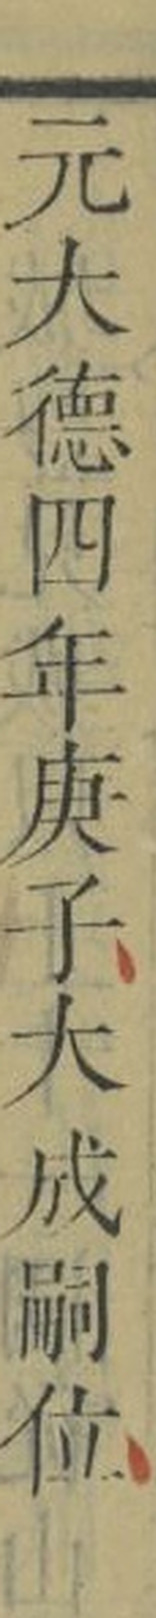元大徳四年庚子大成嗣位
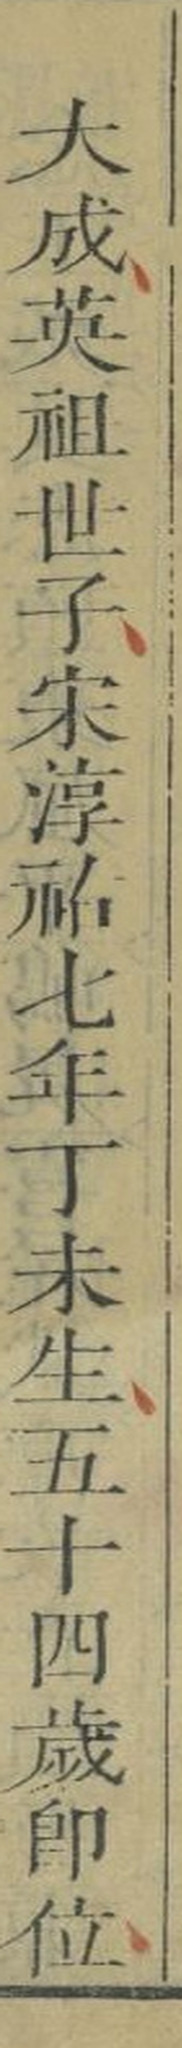大成英祖世子宋淳祐七年丁未生五十四歳即位
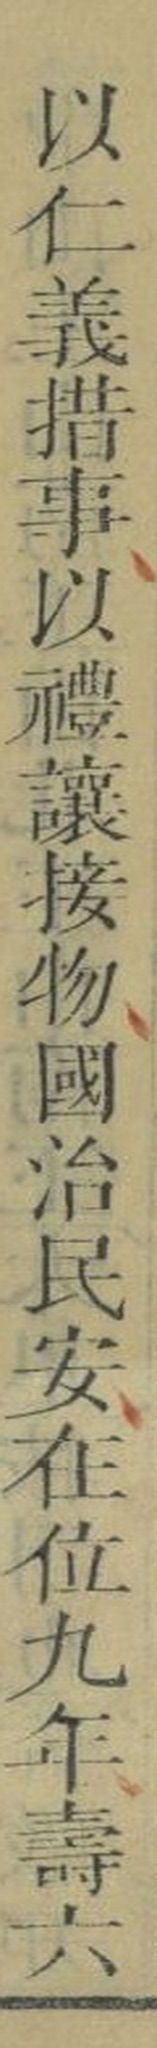以仁義措事以礼譲接物国治民安在位九年寿六
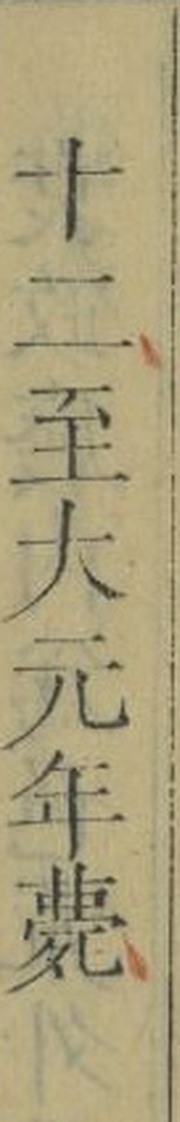十二年至大元年薨
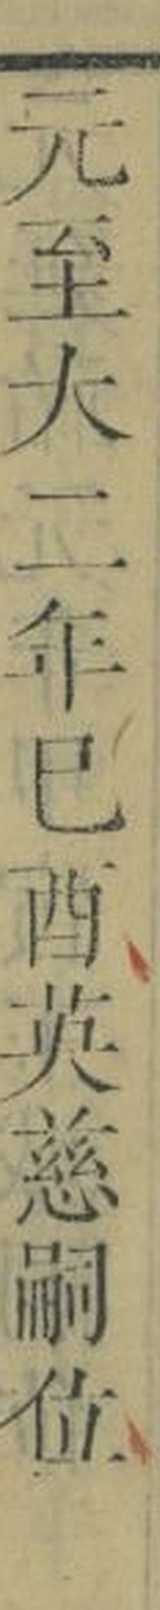元至大二年巳酉英慈嗣位
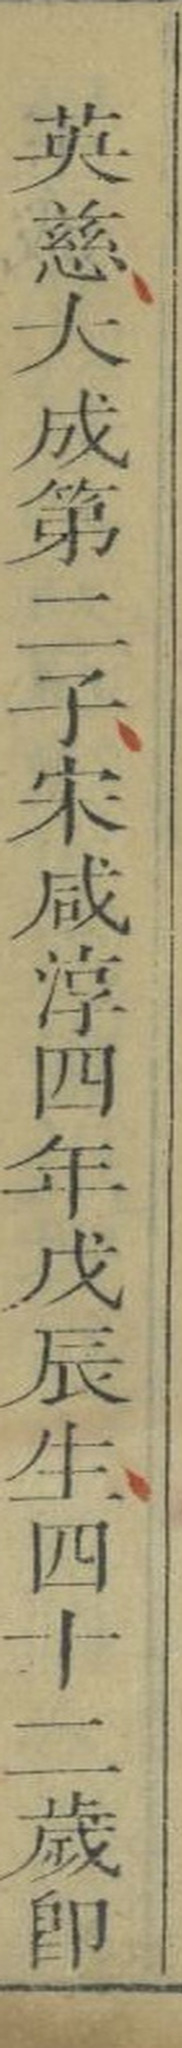英慈大成第二子宋咸淳四年戊辰生四十二歳即
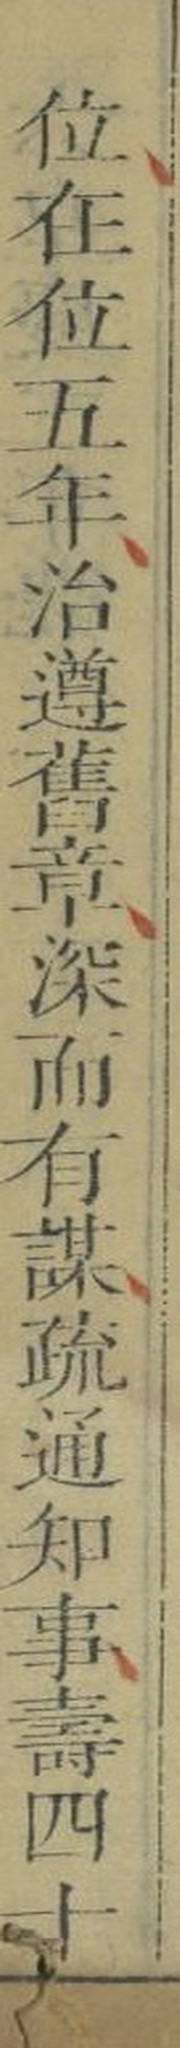位在位五年治遵旧章深而有謀疏通知事寿四十

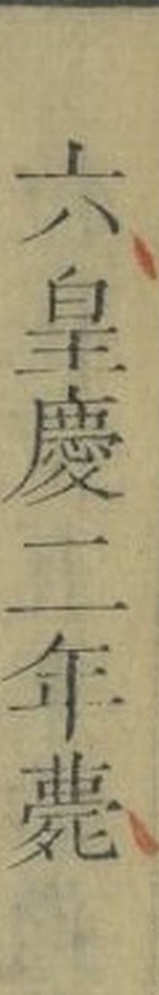六皇慶二年薨
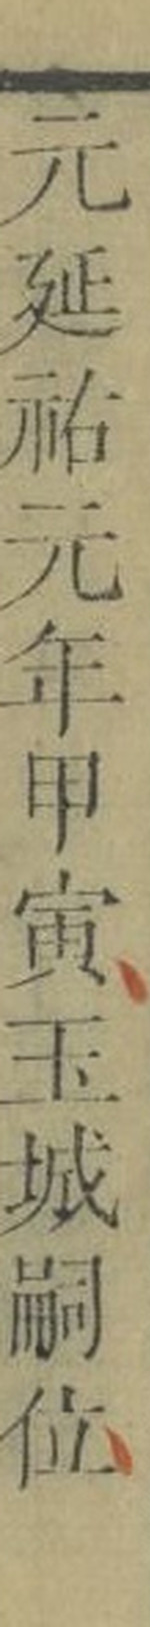元延祐元年甲寅玉城嗣位
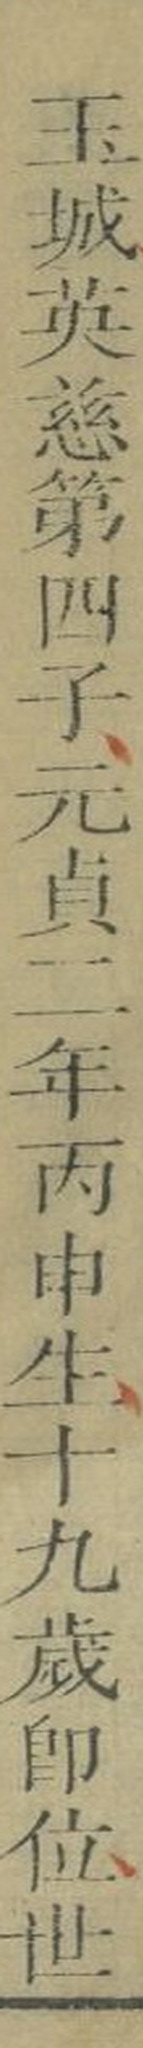玉城英慈第四子元貞二年丙申生十九歳即位世
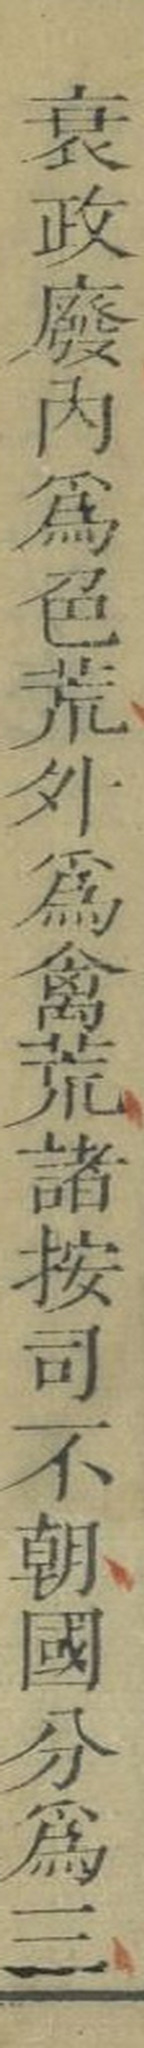衰政廃内為色荒外為禽荒諸按司不朝国分為三
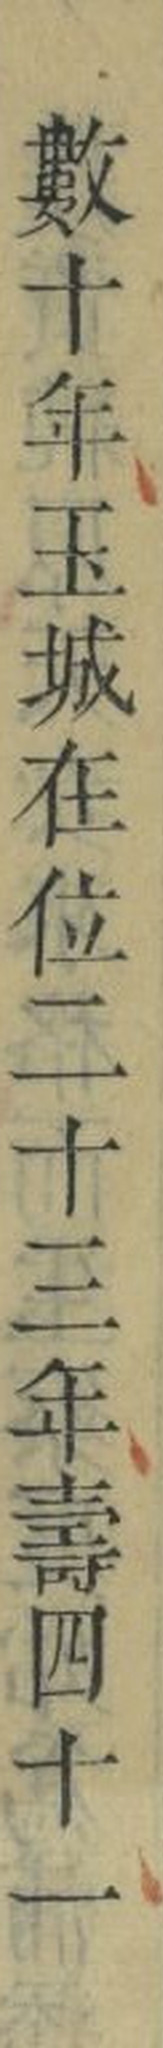数十年玉城在位二十三年寿四十一
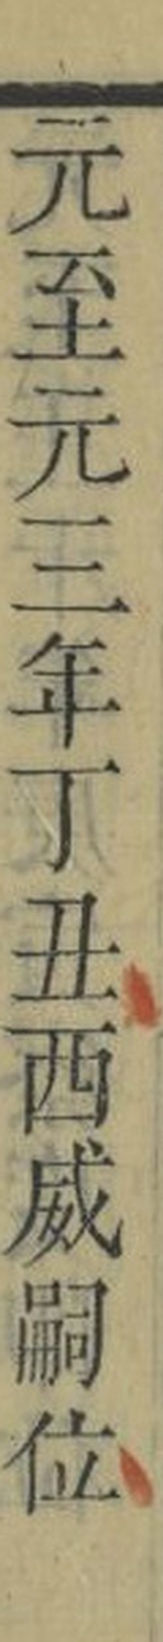元至元三年丁丑西威嗣位
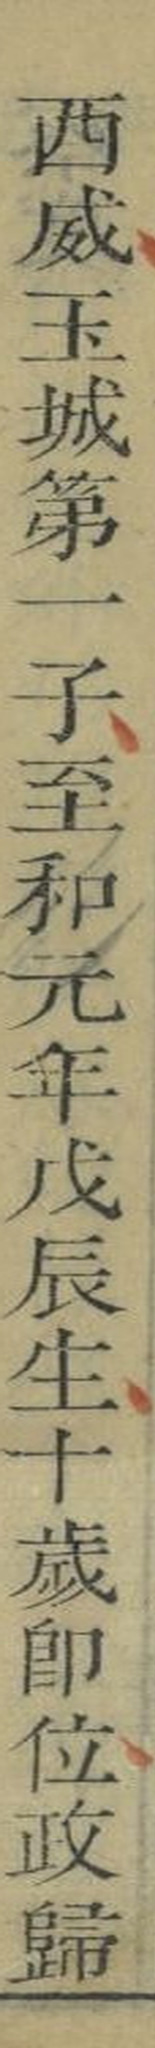西威玉城第一子至和元年戊辰生十歳即位政帰
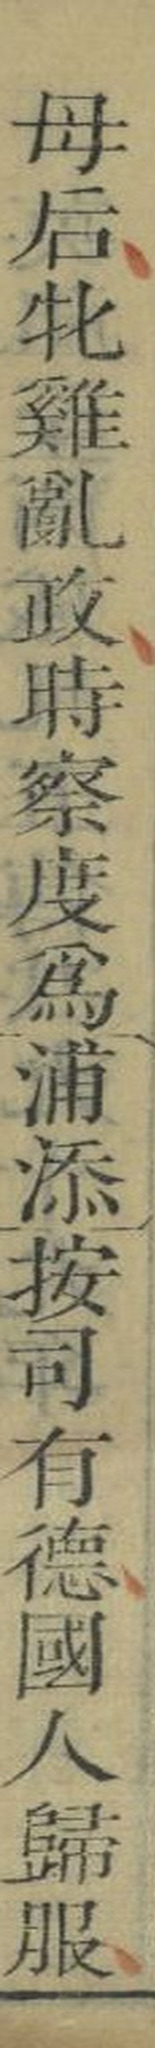母后牝鶏乱政時察度為[浦添]按司有徳国人帰服
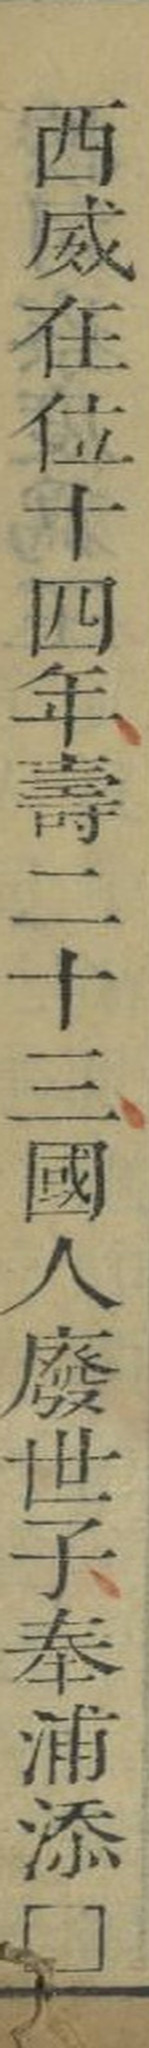西威在位十四年寿二十三国人廃世子奉浦添▢
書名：中山伝信録 巻三
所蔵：University of the Ryukyus Library
